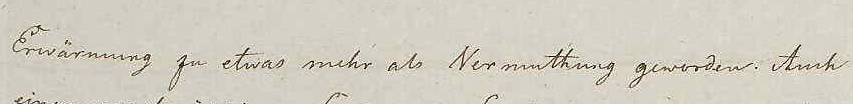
Erwärmung zu etwas mehr als Vermuthung geworden. Auch
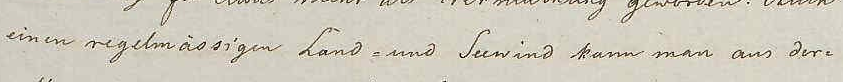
einen regelmässigen Land- und Seewind kann man aus der-
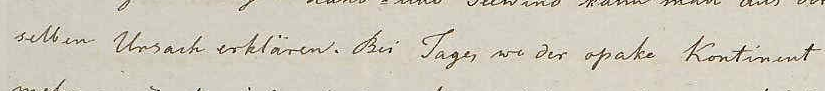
selben Ursach erklären. Bei Tage, wo der opake Kontinent
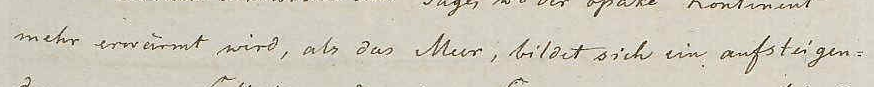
mehr erwärmt wird, als das Meer, bildet sich ein aufsteigen-
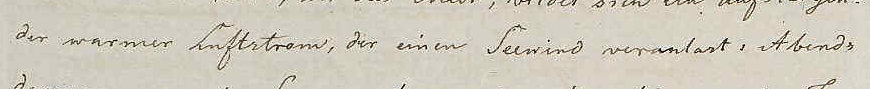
der warmer Luftstrom, der einen Seewind veranlast: Abends
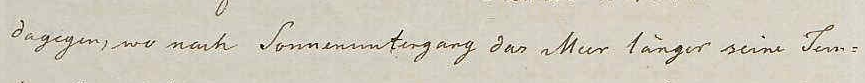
dagegen, wo nach Sonnenuntergang das Meer länger seine Tem-
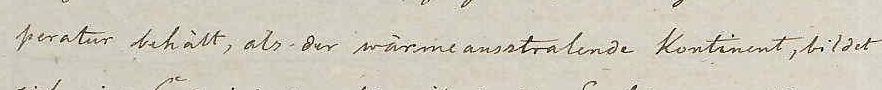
peratur behält, aus der wärmeausstralende Kontinent, bildet
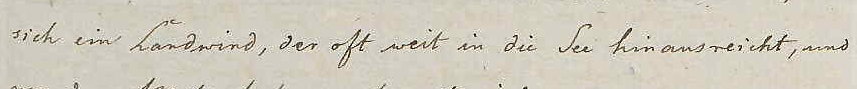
sich ein Landwind, der oft weit in die See hinausreicht, und
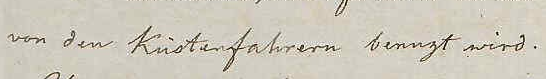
von den Küstenfahrern benuzt wird.
